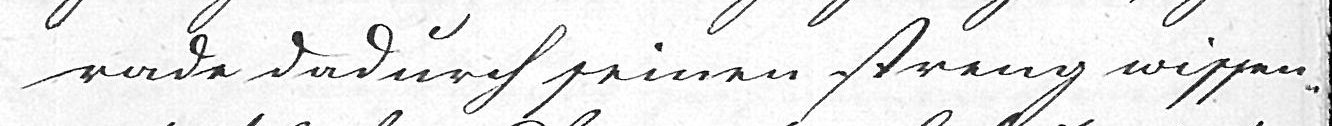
rade dadurch seinen streng wissen-
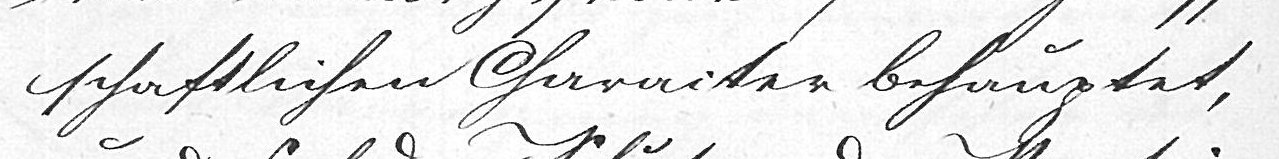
schaftlichen Character behauptet,
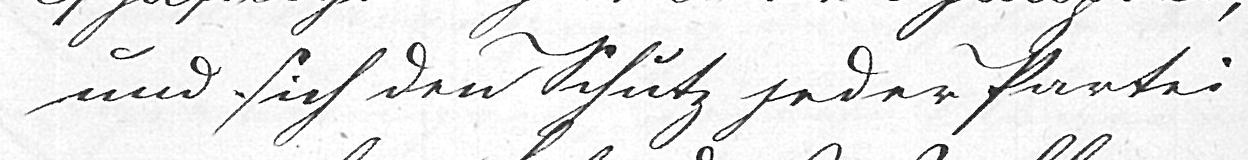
und sich den Schutz jeder Partei
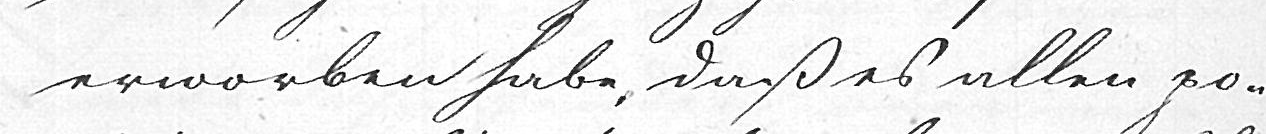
erworben habe, daß es allen po-
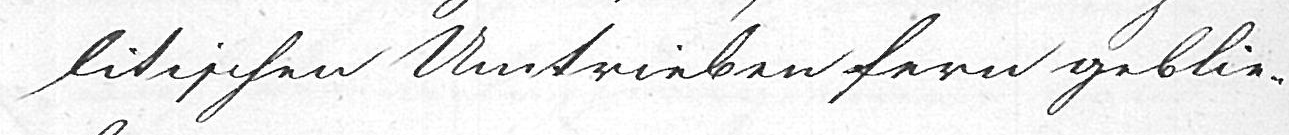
sitischen Untrieben fern geblie-
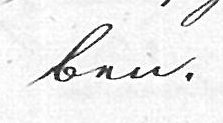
ben.
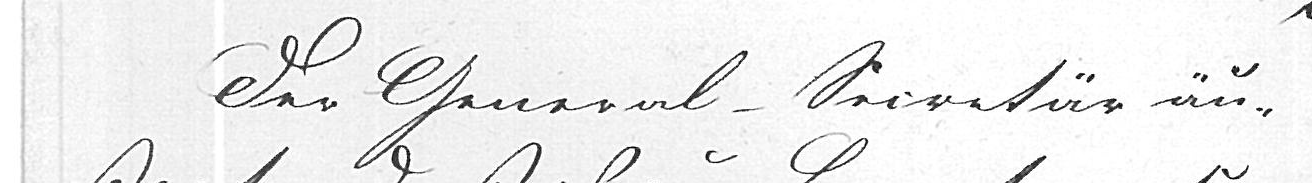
Die General-Secretär äu-
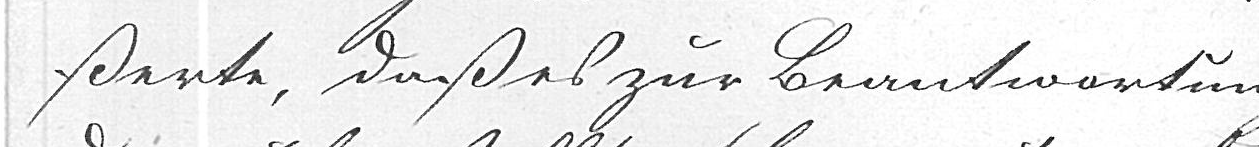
ßerte, daß es zur Beantwortung
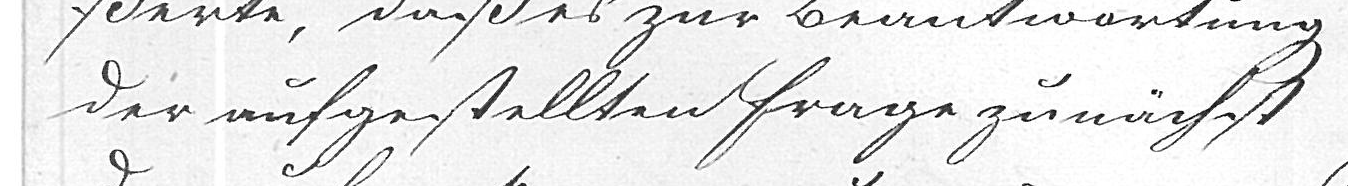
der aufgestellten Frage zunächst
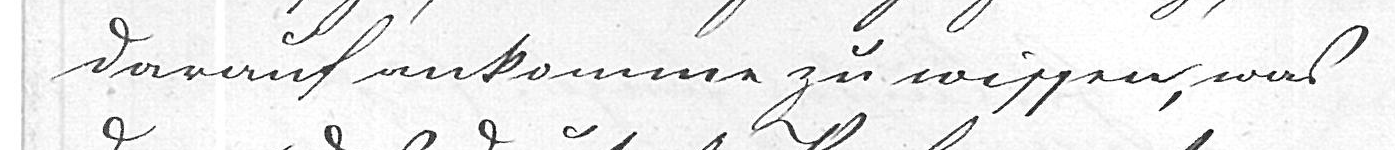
darauf ankomme zu wissen, was
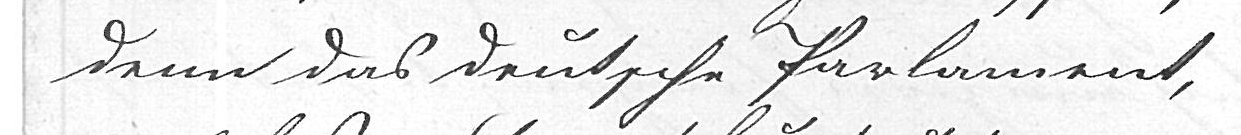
denn das deutsche Parlament,
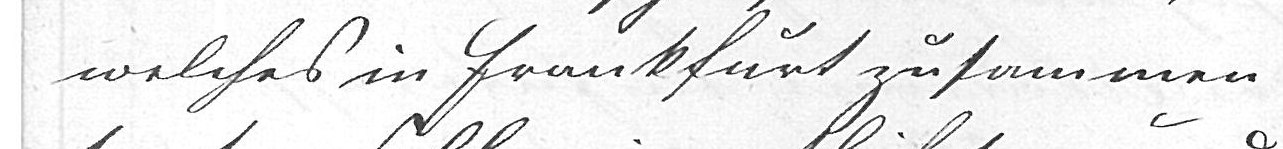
welches in Frankfurt zusammen-
